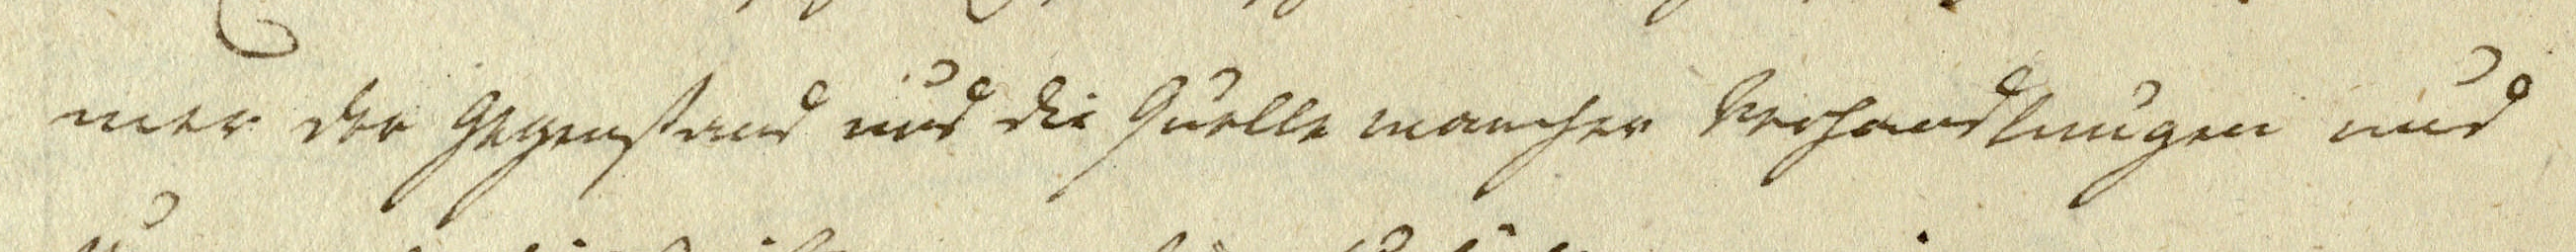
mer der Gegenstand und die Quelle mancher Verhandlungen und
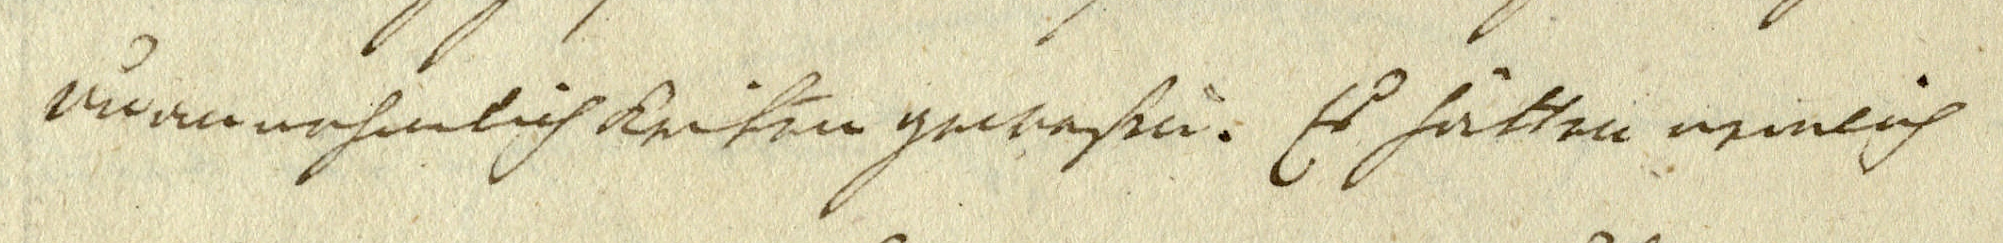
Unannehmlichkeiten gewesen. Es hätten nemlich
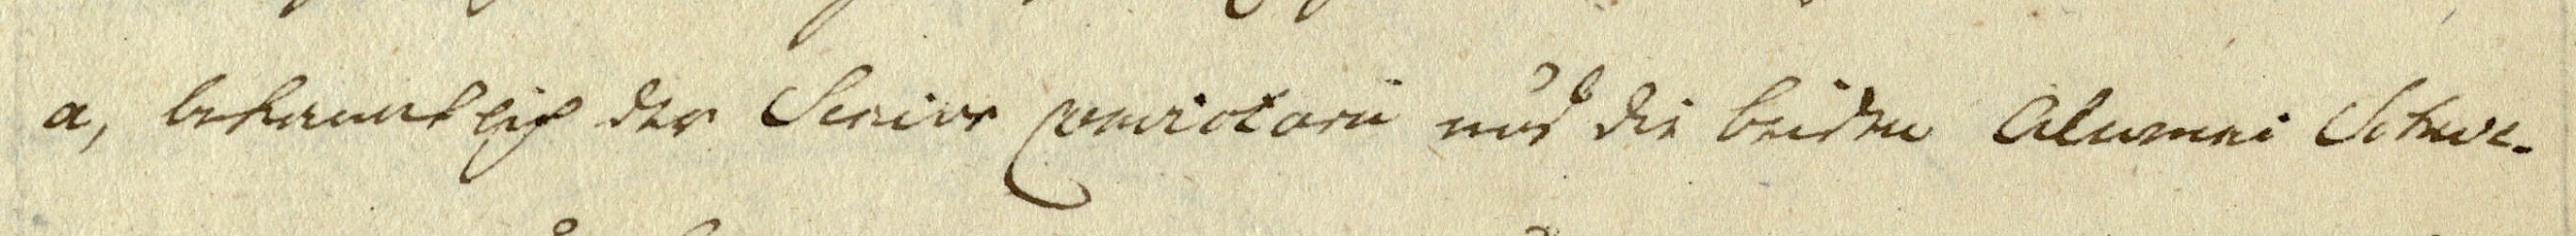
a, bekanntlich der Senior Convictorii und die beiden Alumni Schwe¬
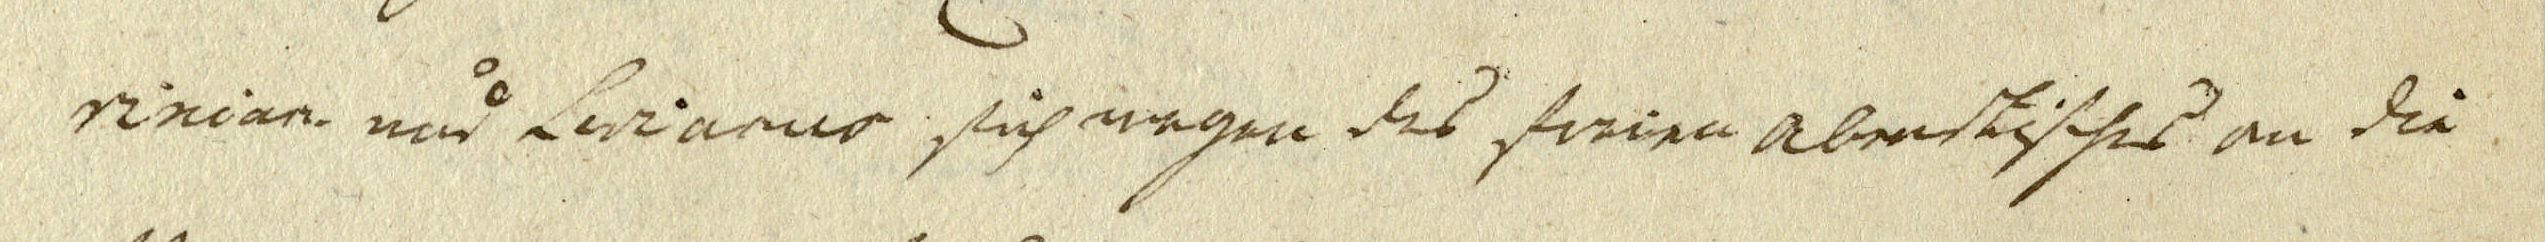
rinian. und Levianus sich wegen des freien Abendtisches an die
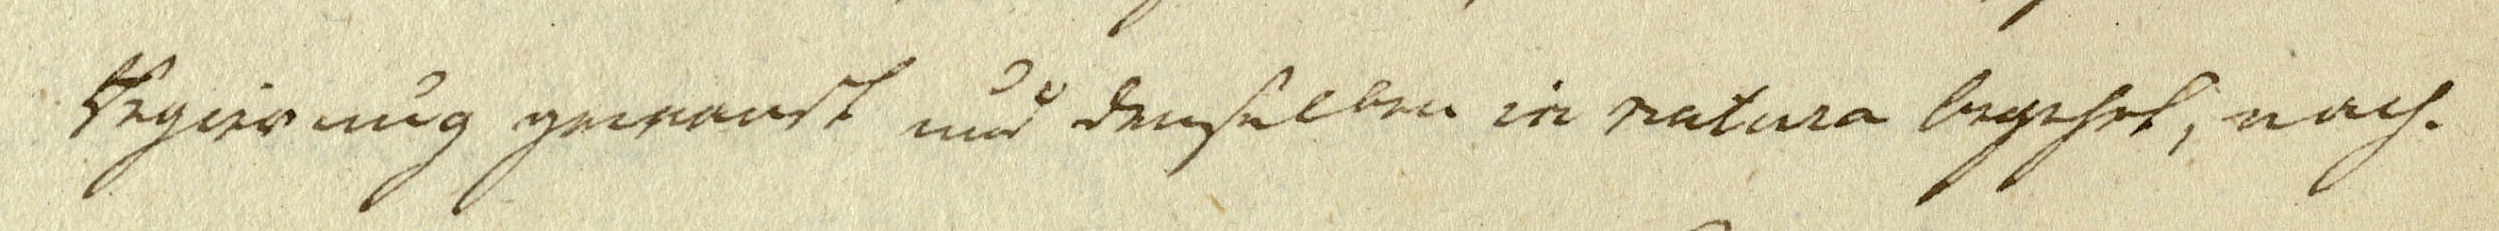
Regierung gewandt und denselben in natura begehrt, nach¬
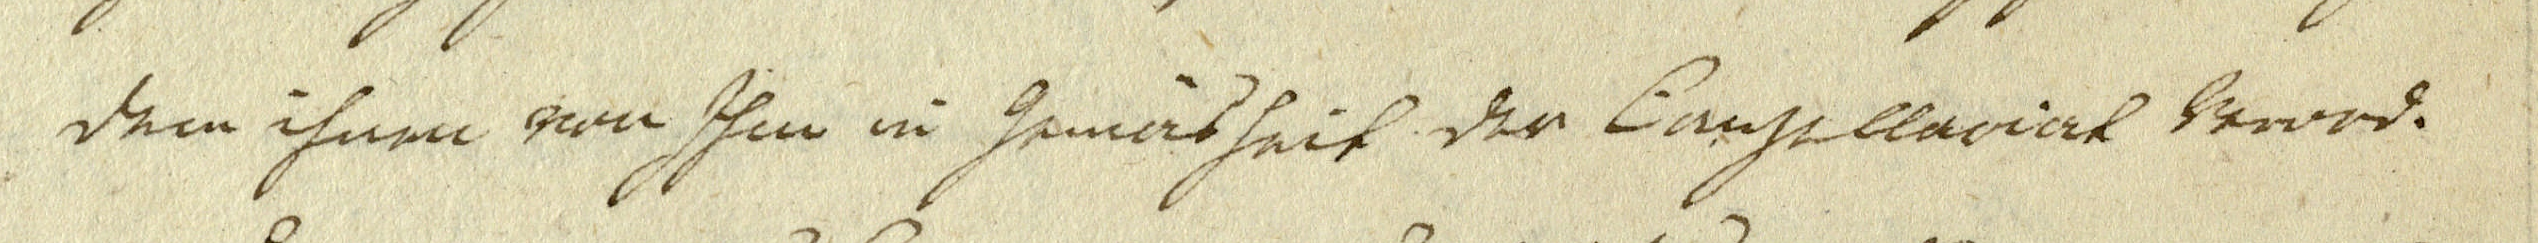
dem ihnen von Ihm in Gemäsheit der Canzellariat Verord¬
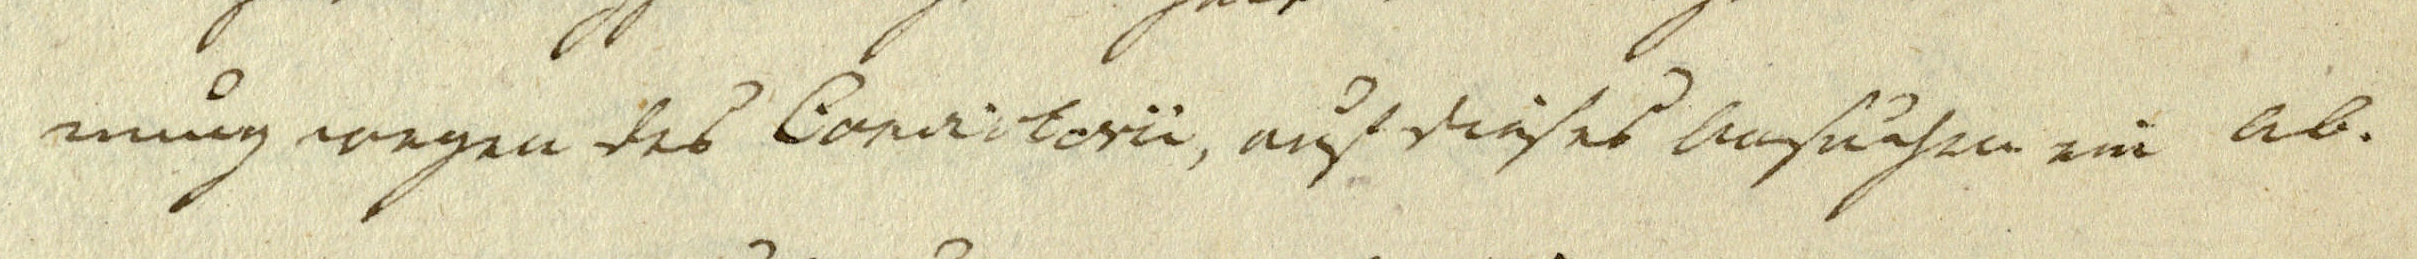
nung wegen des Convictorii, auf dieses Ansuchen ein Ab¬
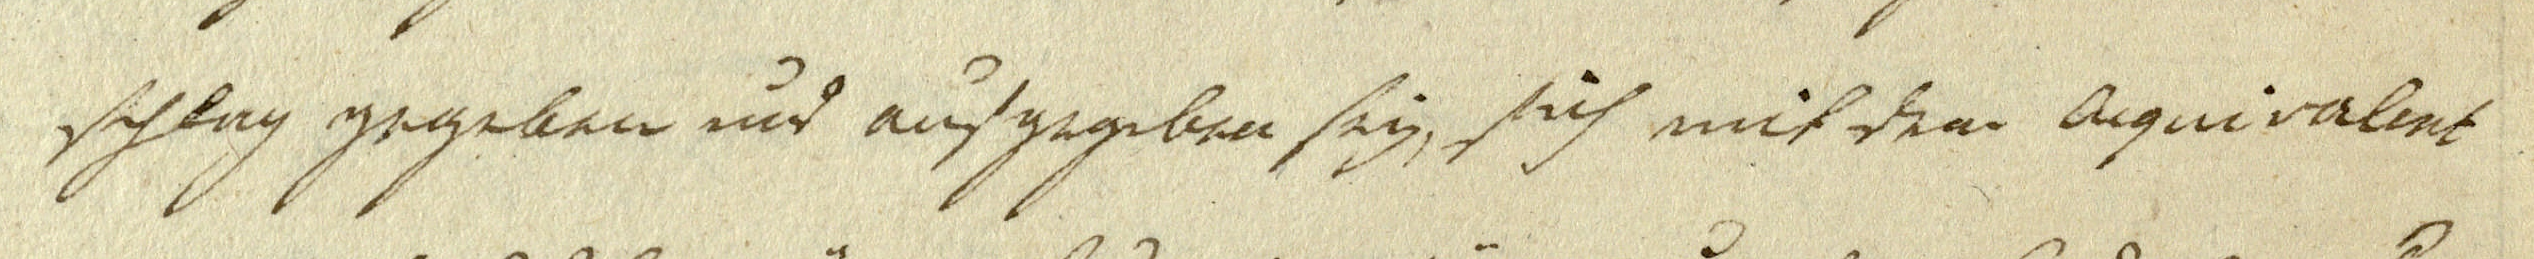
schlag gegeben und aufgegeben seÿ, sich mit dem Aequivalent
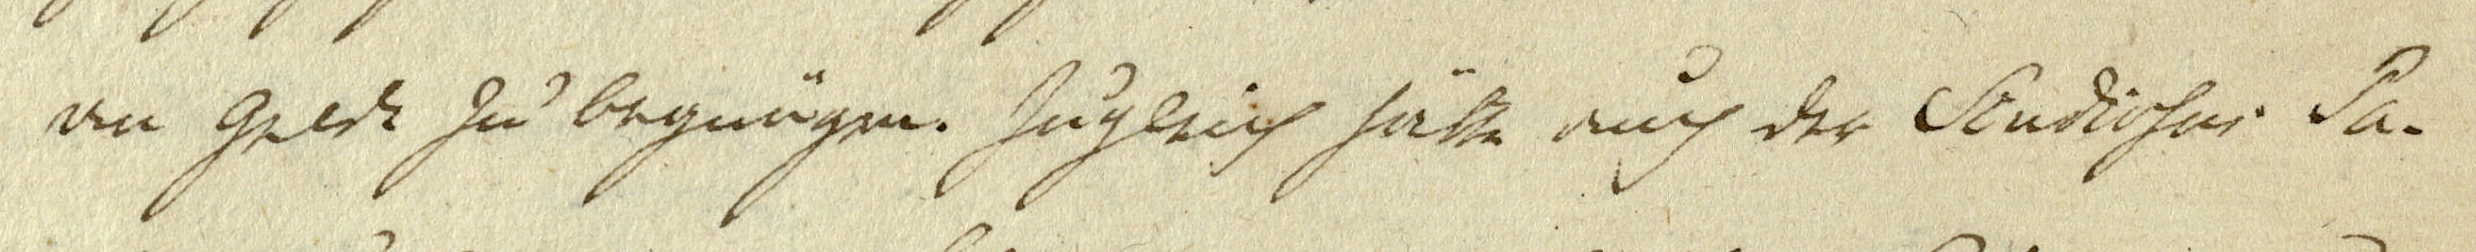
an Gelde zu begnügen. Zugleich hätte auch der Studiosus Pa¬
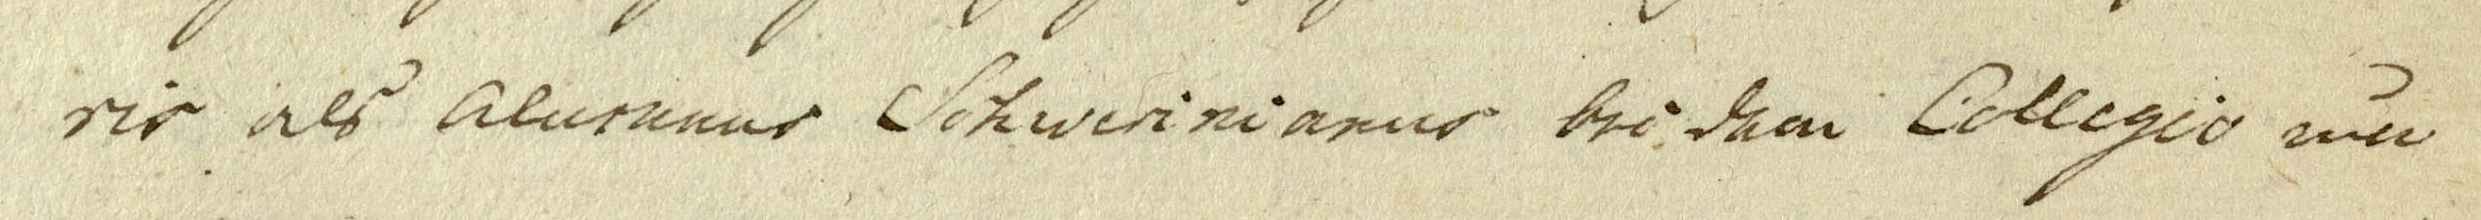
ris als Alumnus Schwerinianus bei dem Collegio um
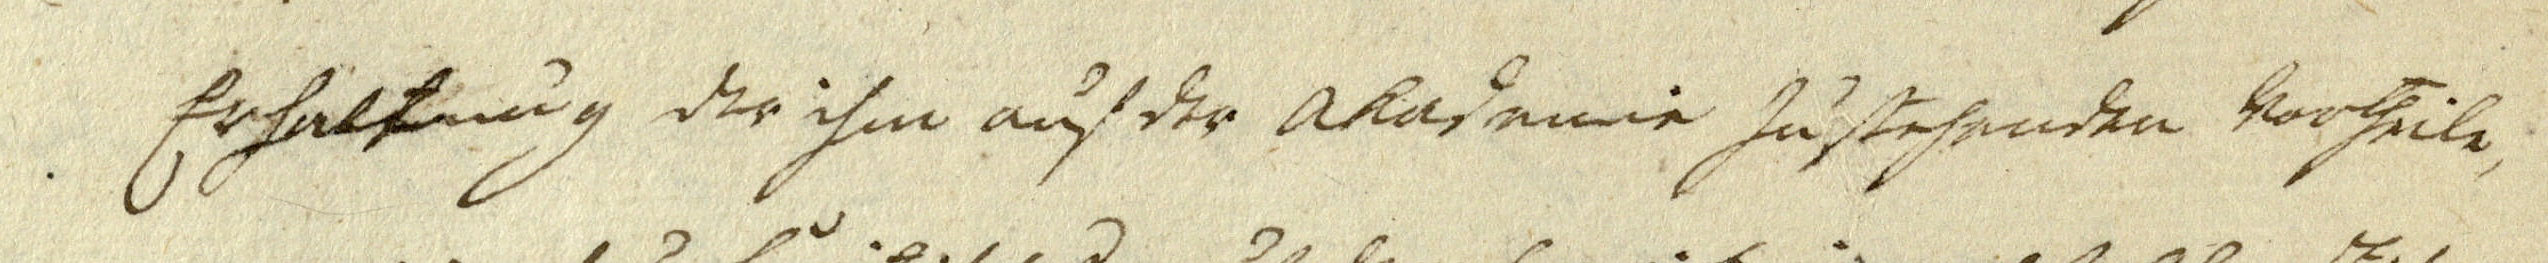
Erhaltung der ihm auf der Akademie zustehenden Vortheile,
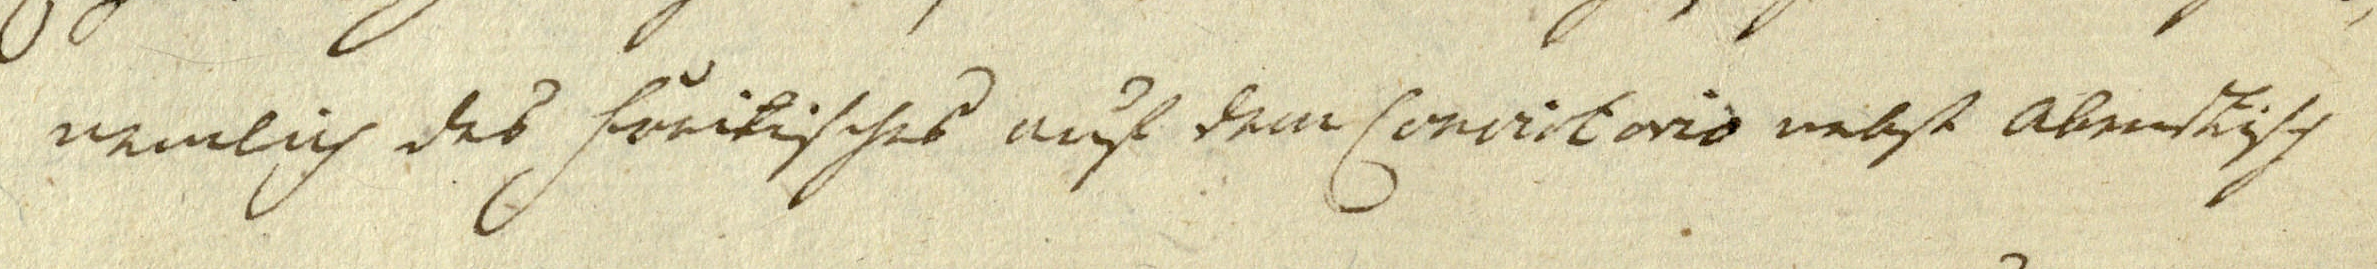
nemlich des Freitisches auf dem Convictorio nebst Abendtisch
